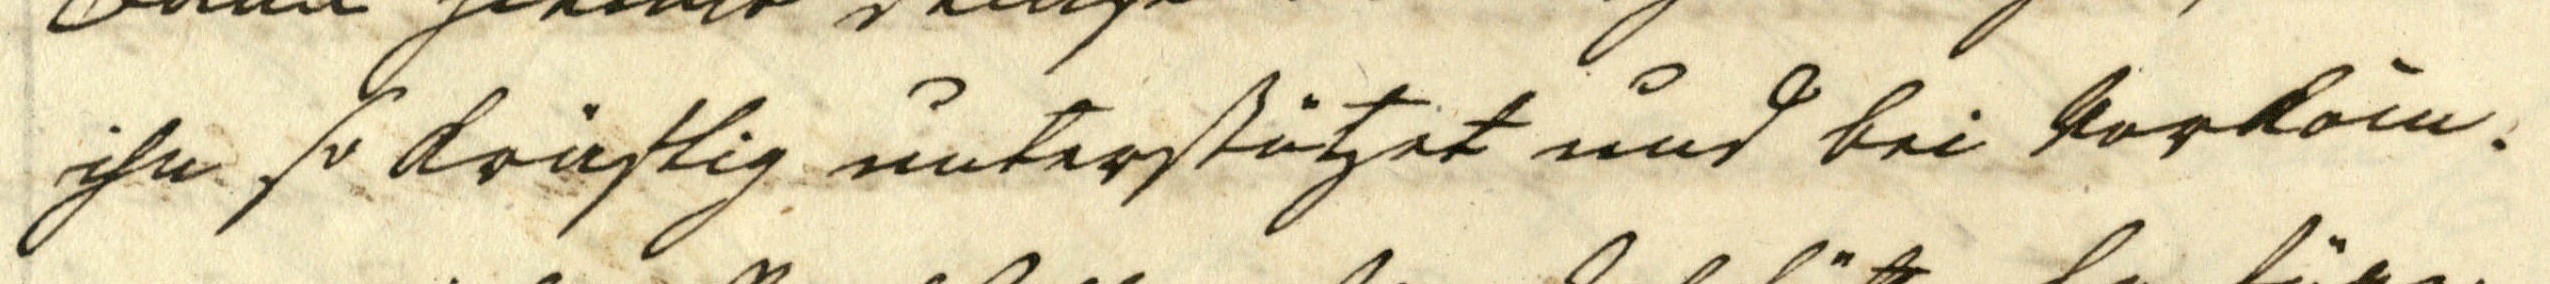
ihn so kräftig unterstützet und bei Vorkom¬
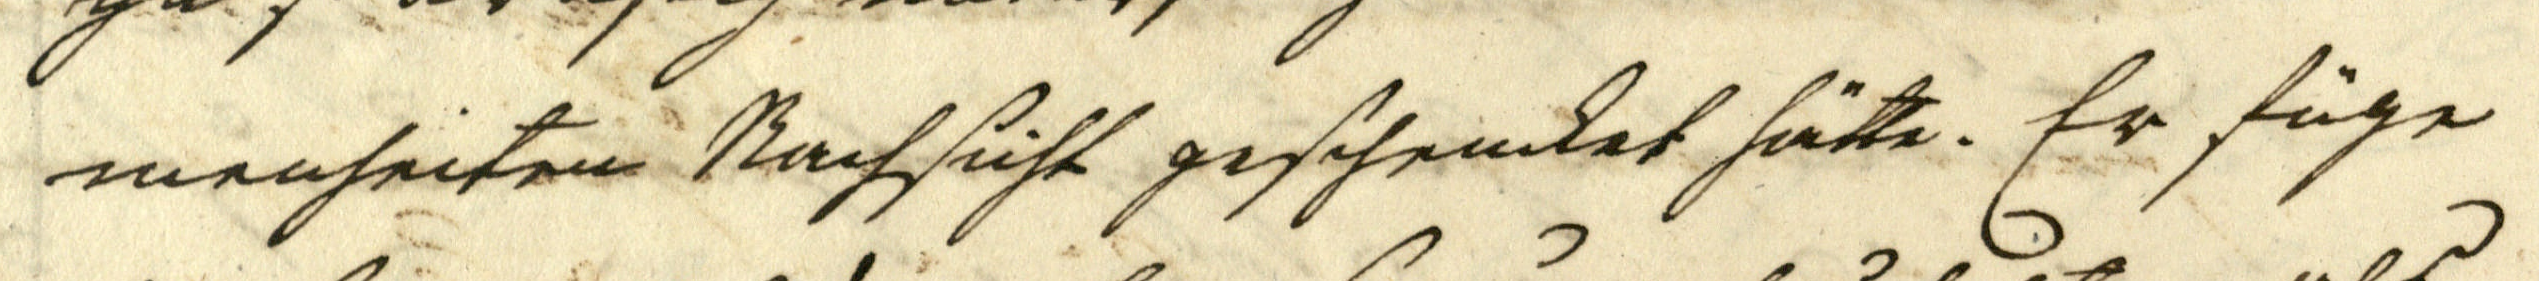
menheiten Nachsicht geschencket hätte. Er füge
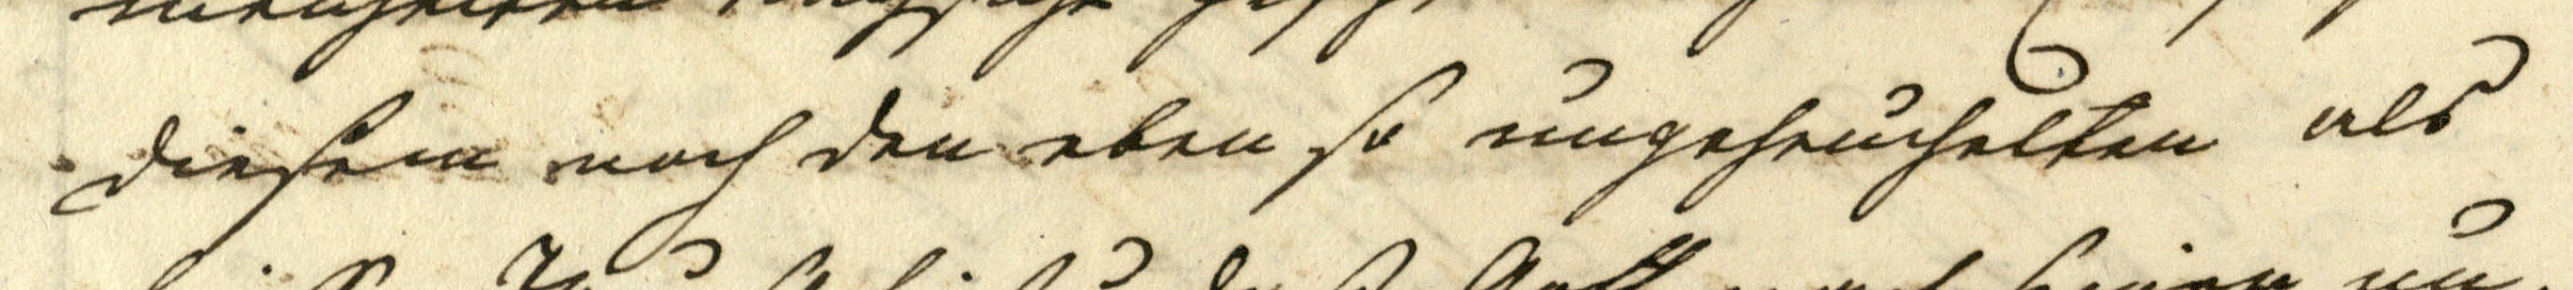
diesem noch den eben so ungeheuchelten als
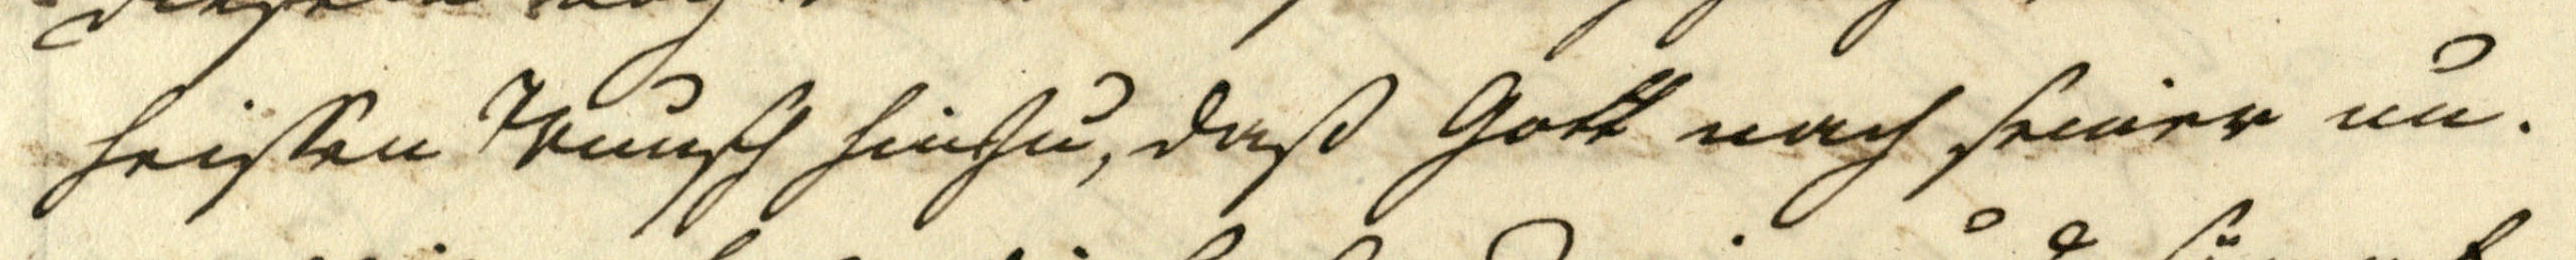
heissen Wunsch hinzu, daß Gott nach seiner un¬
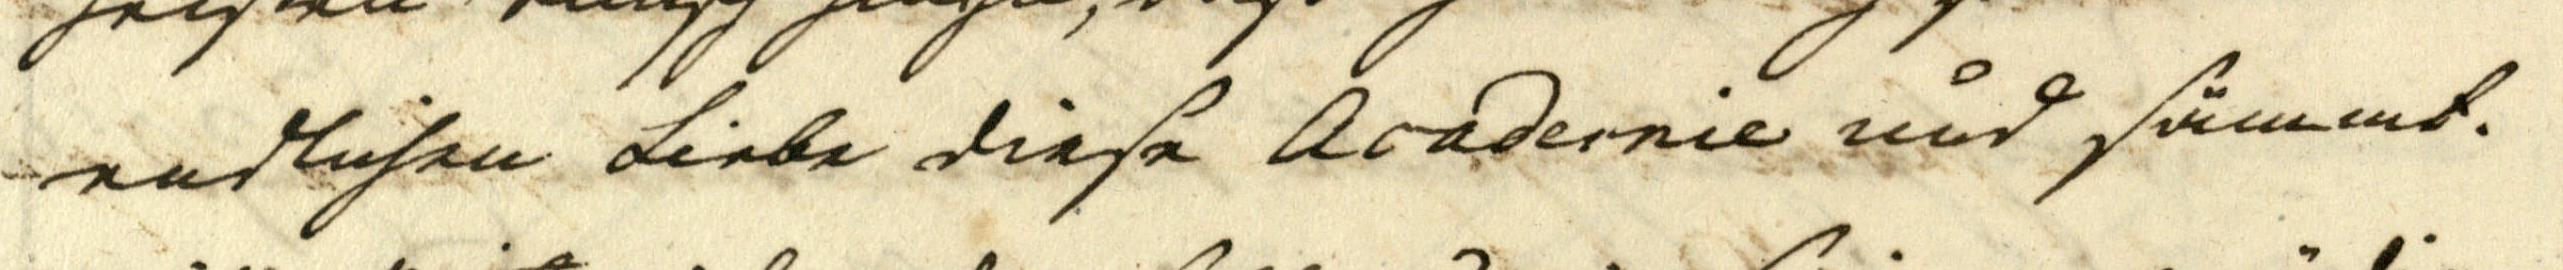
endlichen Liebe diese Academie und sämmt¬
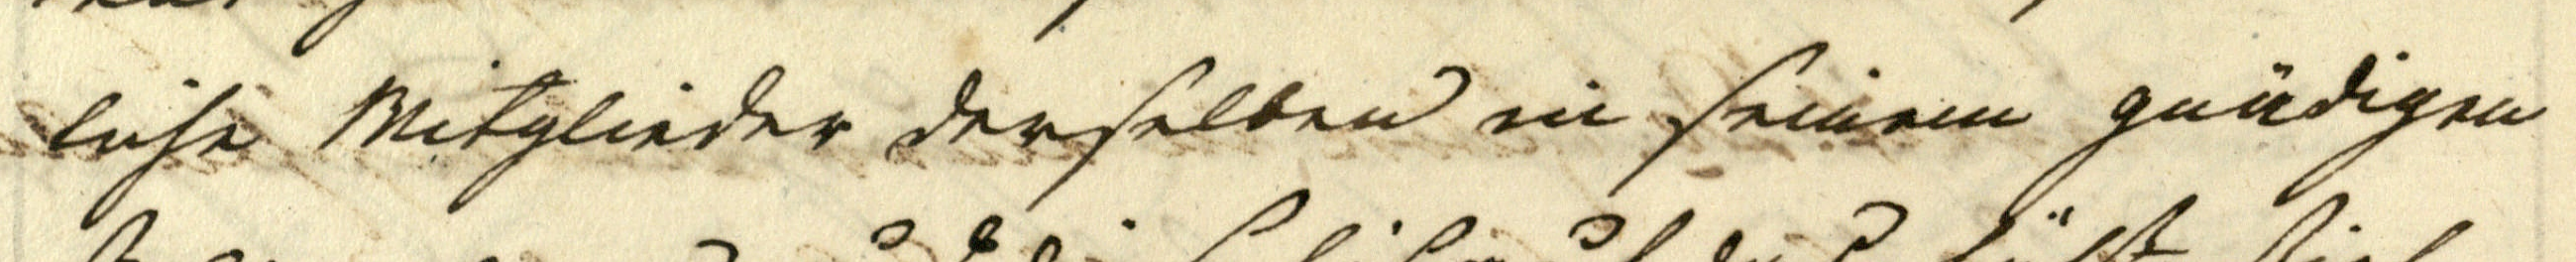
liche Mitglieder derselben in seinem gnädigen
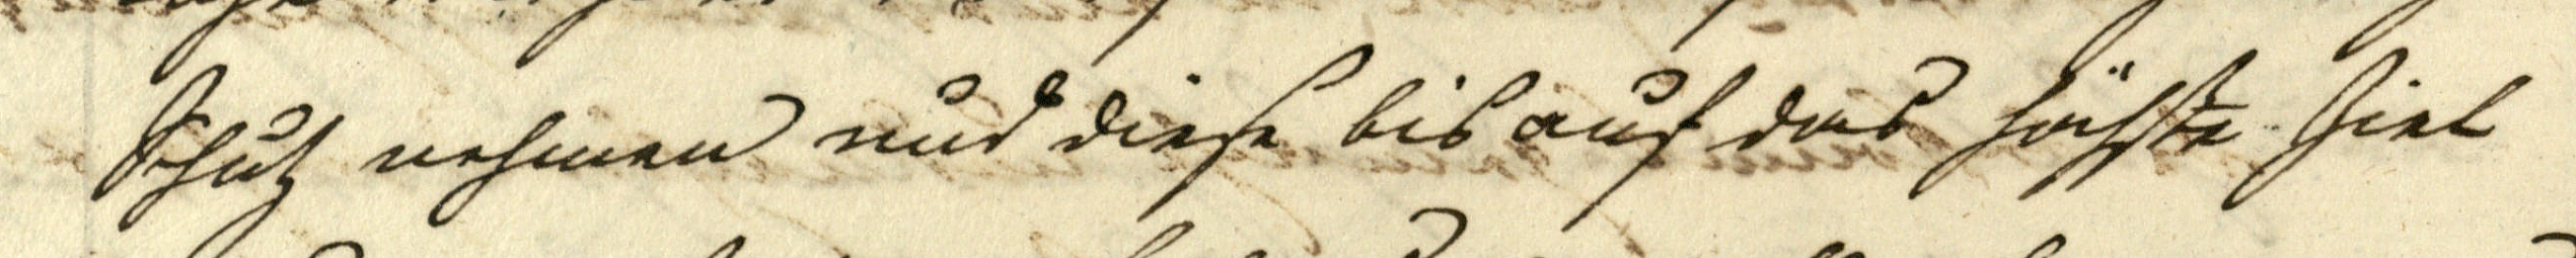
Schutz nehmen und diese bis auf das höchste Ziel
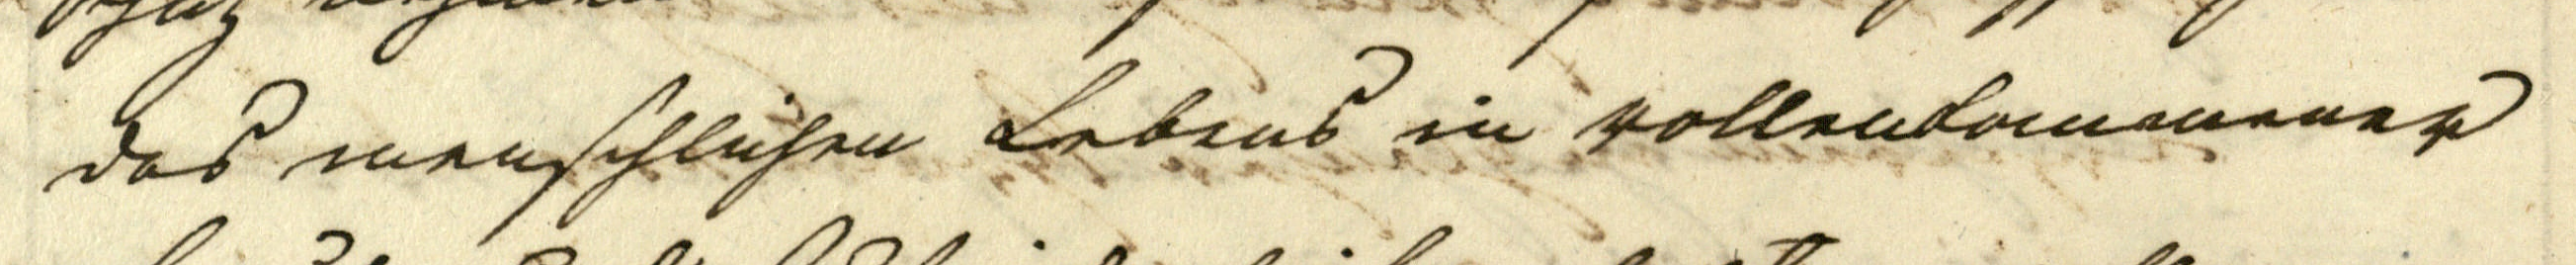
des menschlichen Lebens in vollenkommener
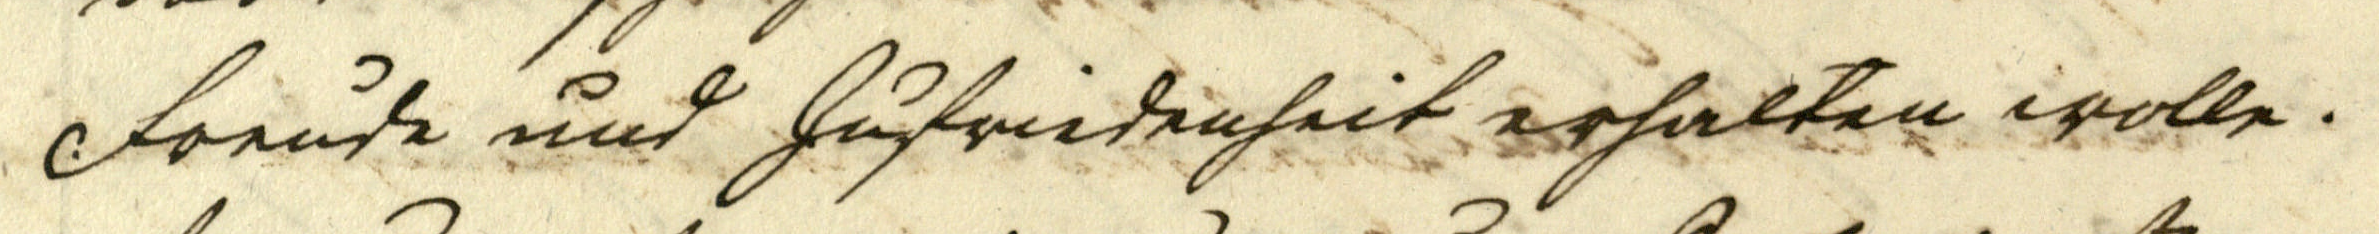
Freude und Zufriedenheit erhalten wolle.
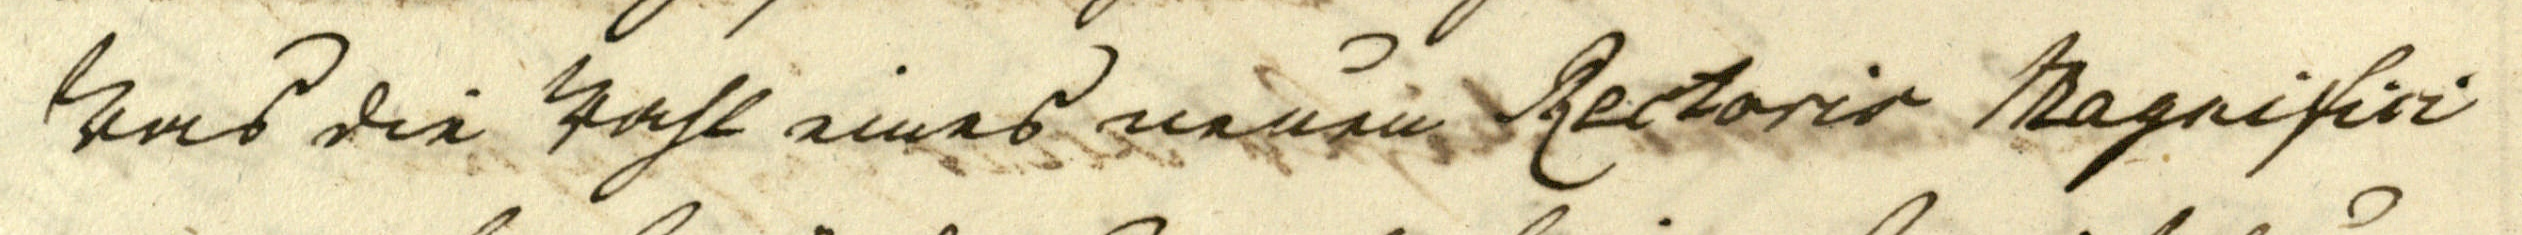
Was die Wahl eines neuen Rectoris Magnifici
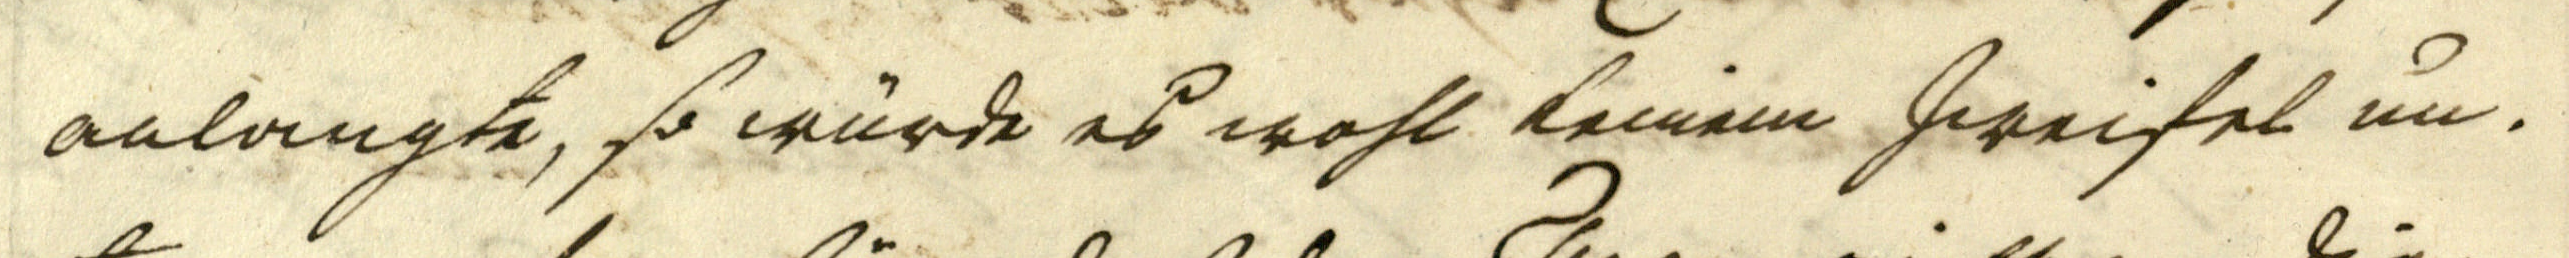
anlangte, so würde es wohl keinem Zweifel un¬
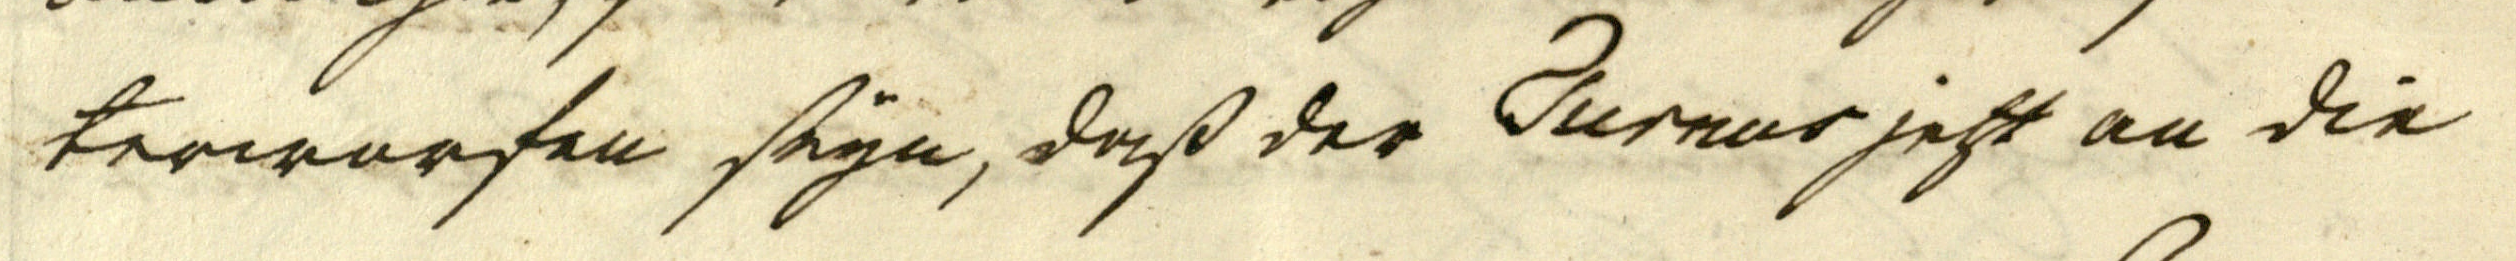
terworfen seÿn, daß der Turnus jetzt an die
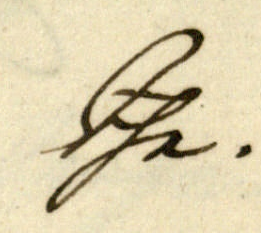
The.
